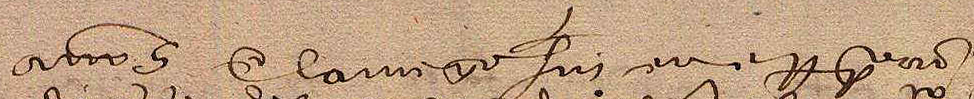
anōs ē lamego fui eu estp̄vaõ
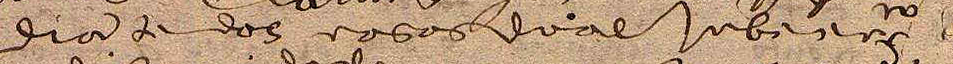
diāte das casas do alJube eccco
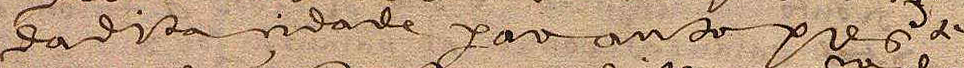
da dita çidade ꝑa o auto presēte
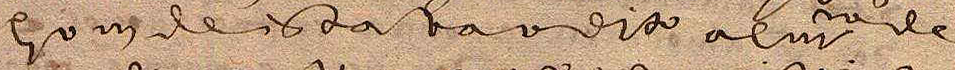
homde estava o dito alurro de
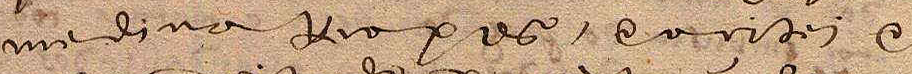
medina Reo preso / e o çitej e
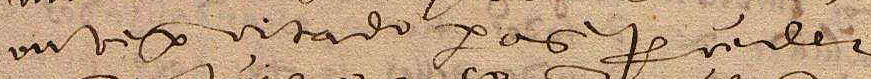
ouve p̄ çitado ꝑa se ꝓçeder
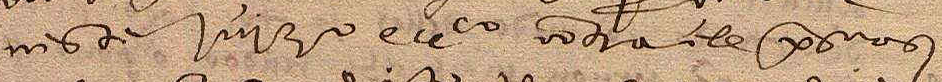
neste Jujzo eccco cōtra ele p̄ suas
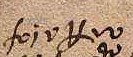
foi o Reo
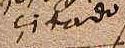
çitado
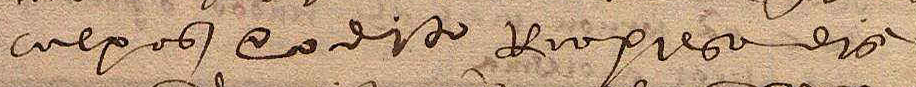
culpas e o djto Reo preso dise
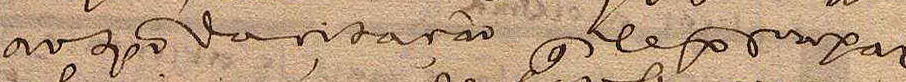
ao tpō da çitação q̄ ele p̄ sua par
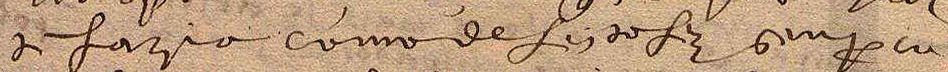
te fazia como de fejto fez seu ꝓcu
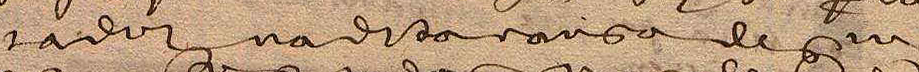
rador na dita causa de seu
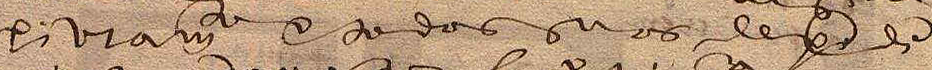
livramto e todas suas depēdē
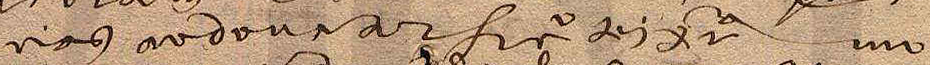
çias ao douctor frco teixrra mo
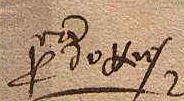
ꝓcā do Reo
